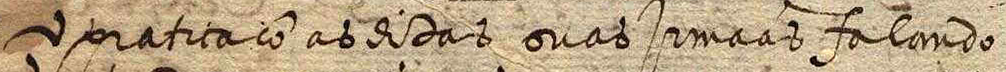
ē pratica cō as ditas suas Jrmaās falando
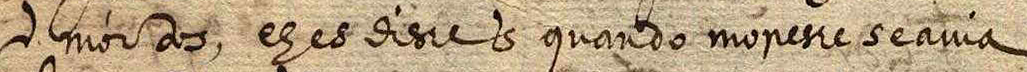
ē mortos, lhes disse q̄ quando morresse se auia
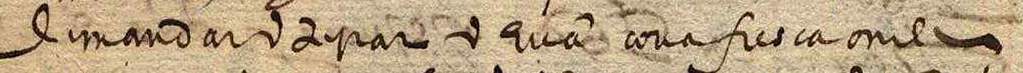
de mandar enterrar ē huā coua fresca onde
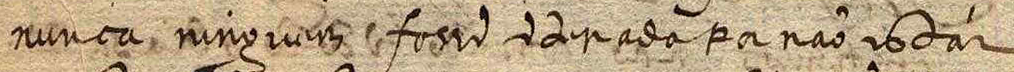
nunca ninguem fosse ēterrada ꝑa naõ estar
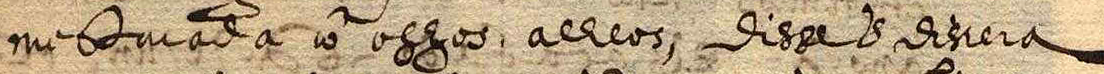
mesturada cō ossos alheos, disse q̄ dissera
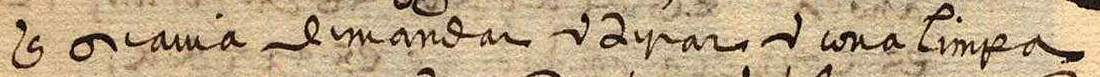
q̄ se auia de mandar ēterrar ē coua limpa
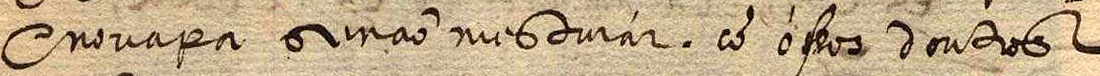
e noua ꝑa naõ mesturar . cō ossos doutros
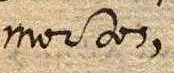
mortos,
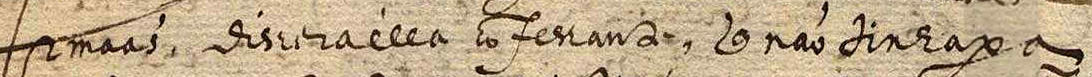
Jrmaās dissera ella cōfessante, q̄ naõ tinha ꝑa
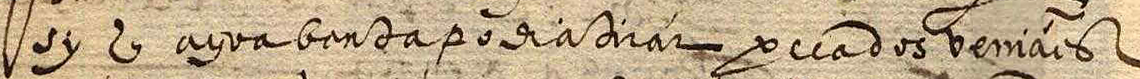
sy q̄ agoa benta podia tirar pecados veniāes
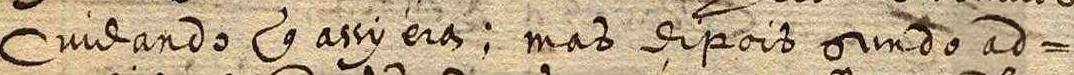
cuidando q̄ assy era; mas dipois sendo ad
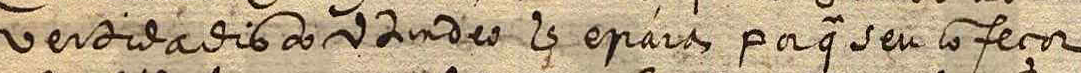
vertida disto ētendeo q̄ errara porq̄ seu cōfeçor
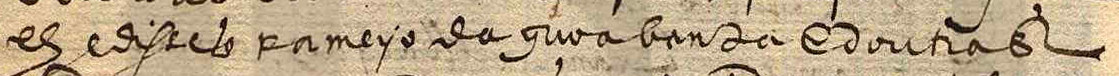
lhe disse q̄ por meyo daguoa benta e doutras
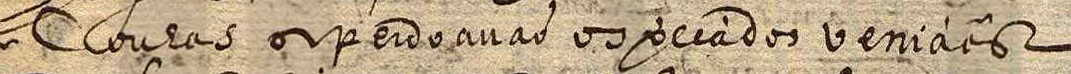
Cousas se perdoauaõ os pec̄ados veniaes
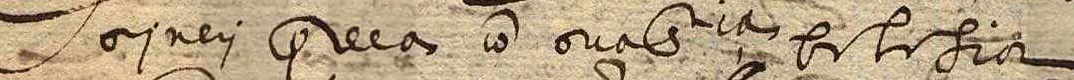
sjney p̄ ella cō sua sria belchior
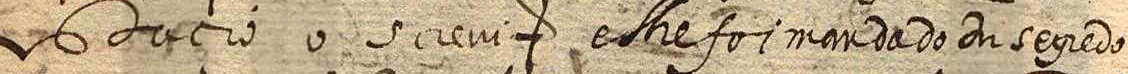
estacio o screui e lhe foi mandado ter segredo
